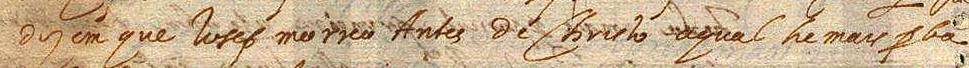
dizem que Iosep morreo Antes de Christo a qual he mais ꝓba
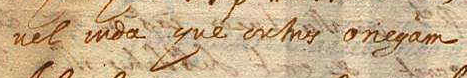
uel inda que outros o negam
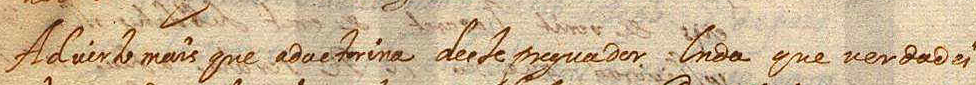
Aduirto mais que a doctrina deste preguador Inda que uerdadei
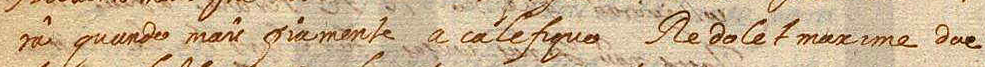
ra quando mais piamente a calefiquo Redolet maxime doc
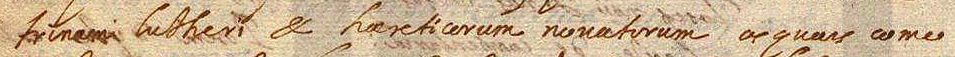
trinam lutheri & hæreticorum nouatorum as quais como
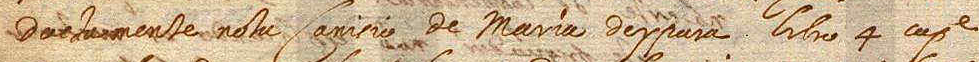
doctamente notu Canisio de Maria de ypara libro 4 cape
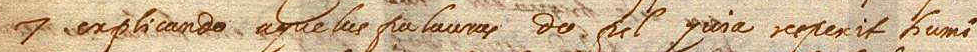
7 explicando aquelas palauras do pel quia respexit humi
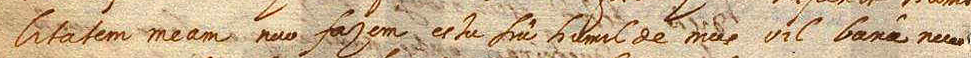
litatem meam nao fazem esta srā humilde mas vil bana reco
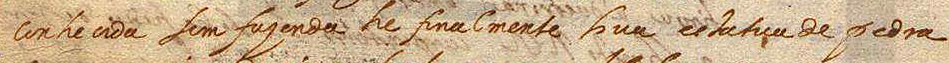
conhecida sem fazenda he finalmente hua estatua de pedra
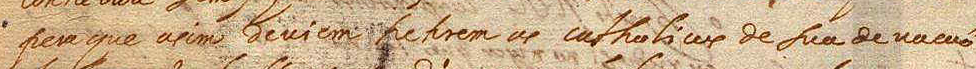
pera que asim deuiem he tirem os catholicos de sua deuoçaõ
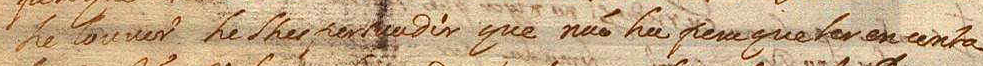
he louuor he lhes persuadir que naõ ha pera que ter em conta
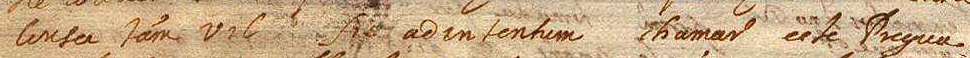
cousa tam vil Sic ad intentum chamar este Pregua
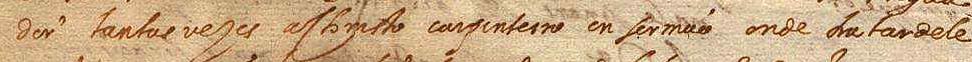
dor tantas uezes a Christo carpinteiro en sermaõ onde tratar dele
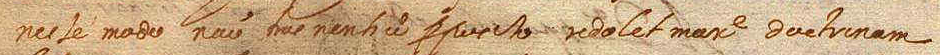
neste modo naõ tras nenhū ꝓposito redalet maxe doctrinam
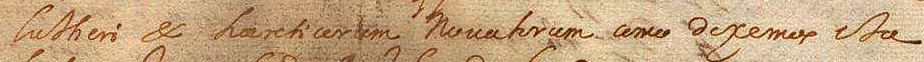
lutheri & hæreticarum nouatorum como dixemos ita
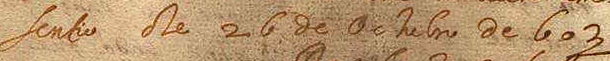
sentio oIe 26 de Octubro de 603
